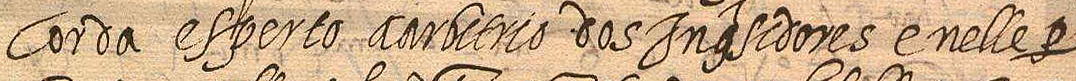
Corda esperto a arbitrio dos Jnq̄isidores e nelle ꝑ
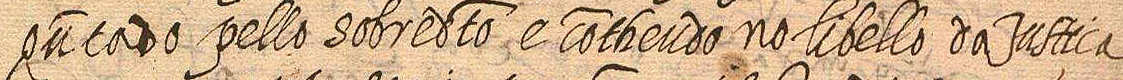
gu̅tado pello sobredt̄o e c̅otheudo no libello da Justiça
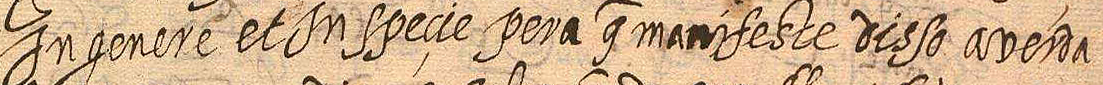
Jn genere et Jn speçie pera q̅ manifeste disso a verda
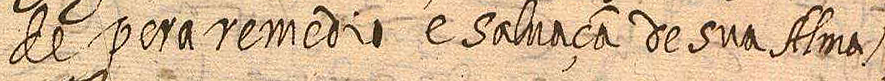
de pera remedio e saluaça̅ de sua Alma /
